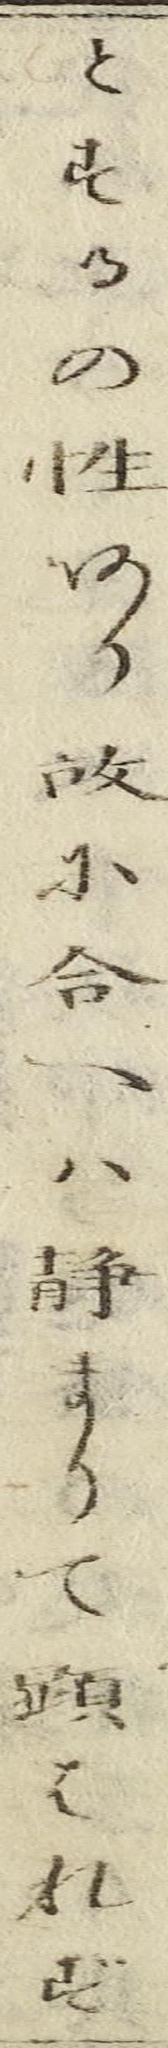とするの性あり故に合へは静まりて顕はれず
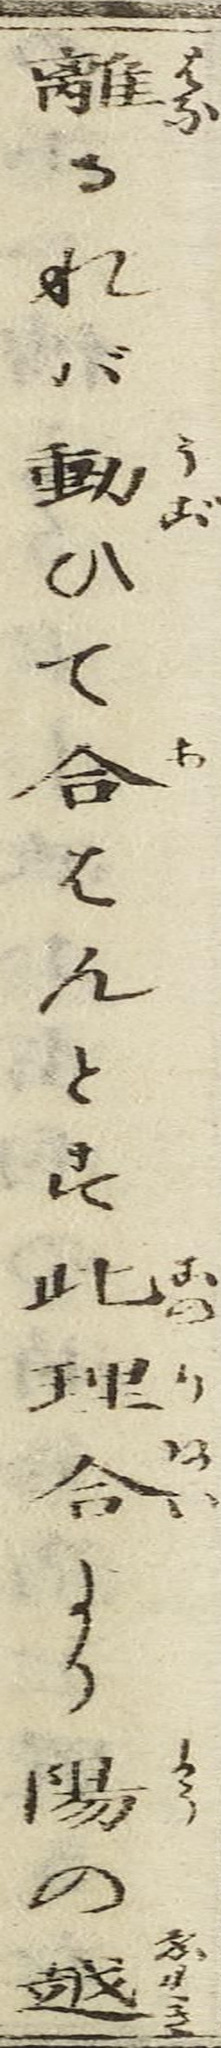離るれば動ひて合はんとす此理合より陽の越
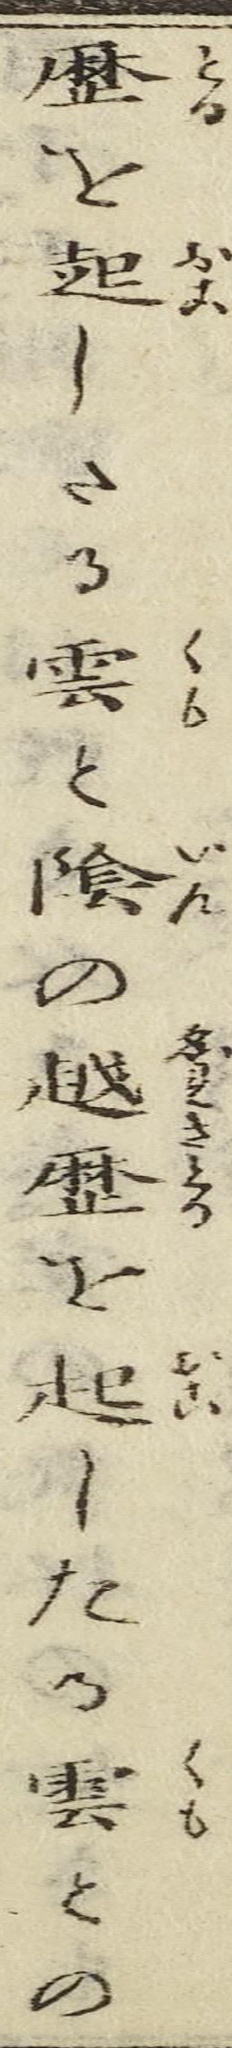歴を起したる雲と陰の越歴を起したる雲との
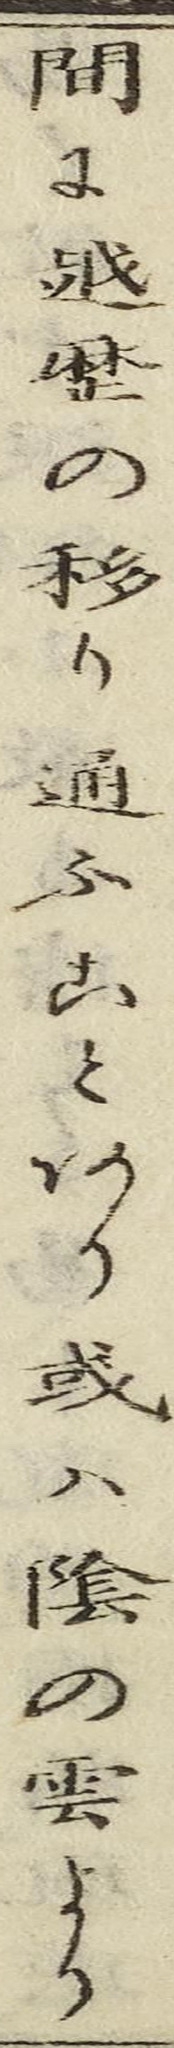間に越歴の移り通ふことあり或は陰の雲より
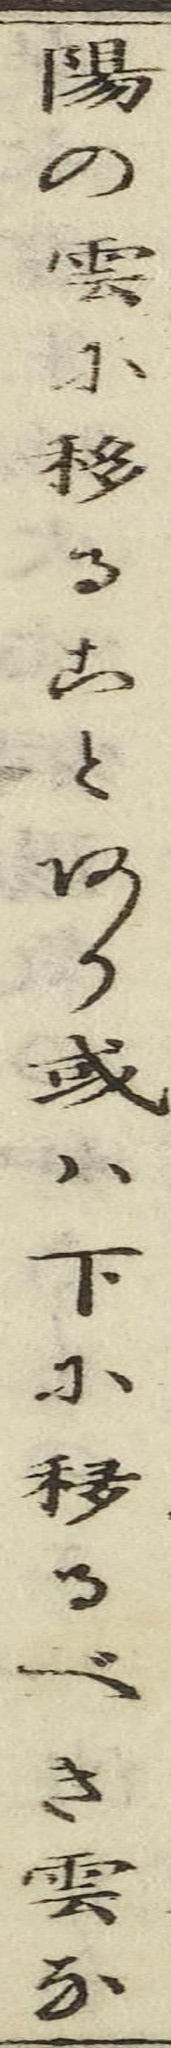陽の雲に移ることあり或は下に移るべき雲な
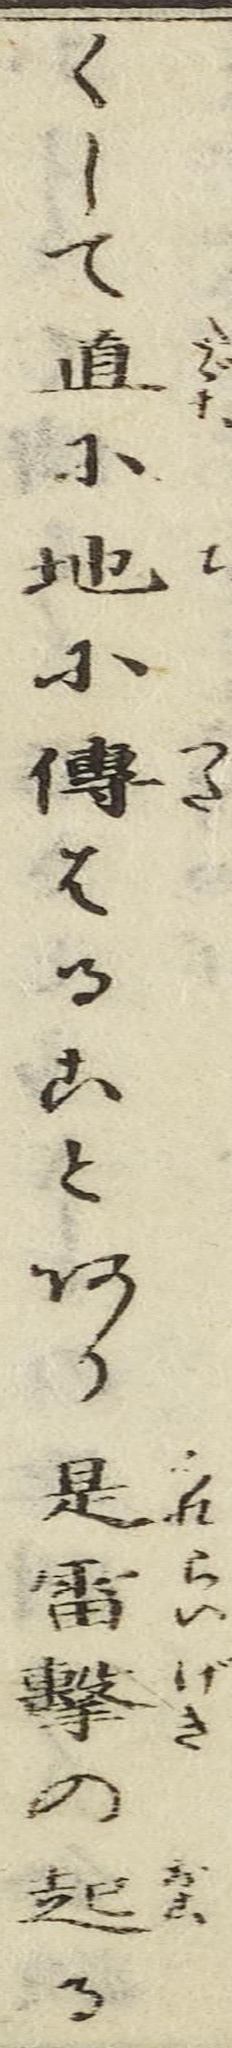くして直に地に伝はることあり是雷撃の起る
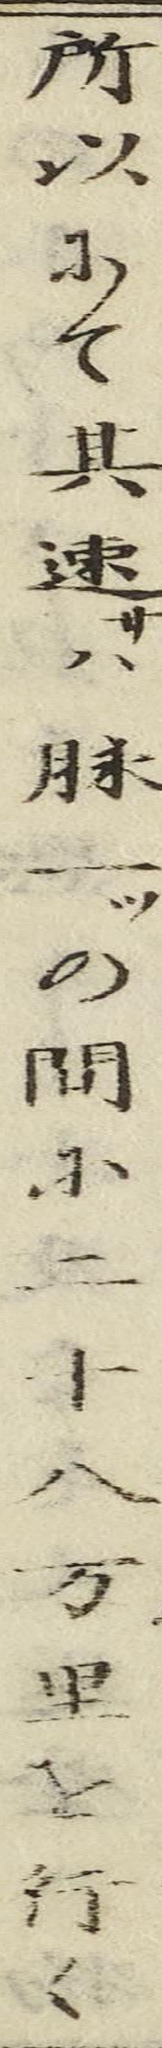所以にて其速サは脈一ツの間に二十八万里を行く
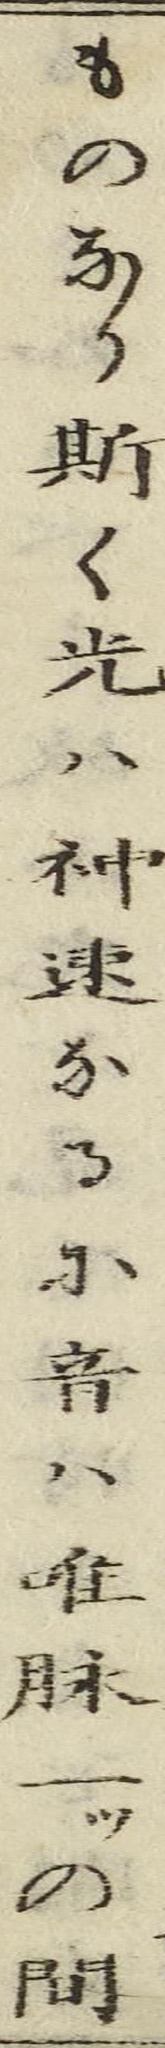ものなり斯く光は神速なるに音は唯脈一ツの間
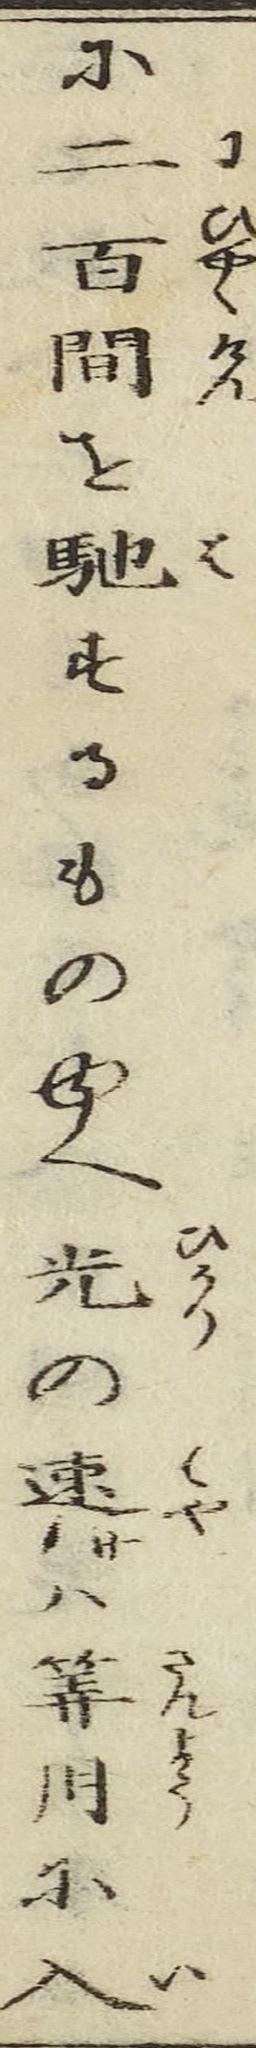に二百間を馳するものゆへ光の速サは算用に入
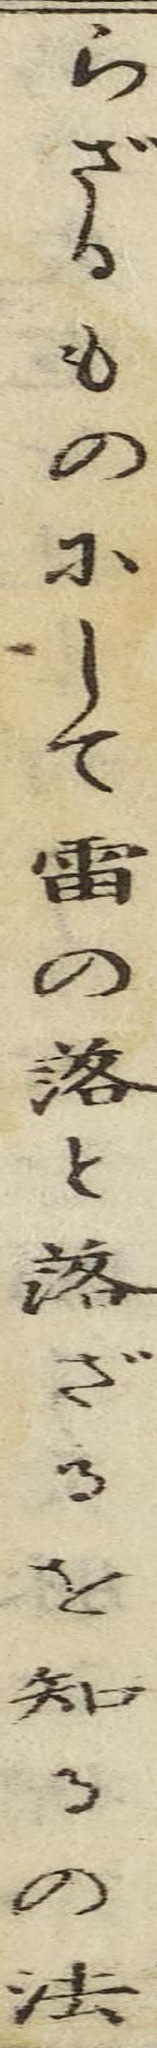らざるものにして雷の落と落ざるを知るの法

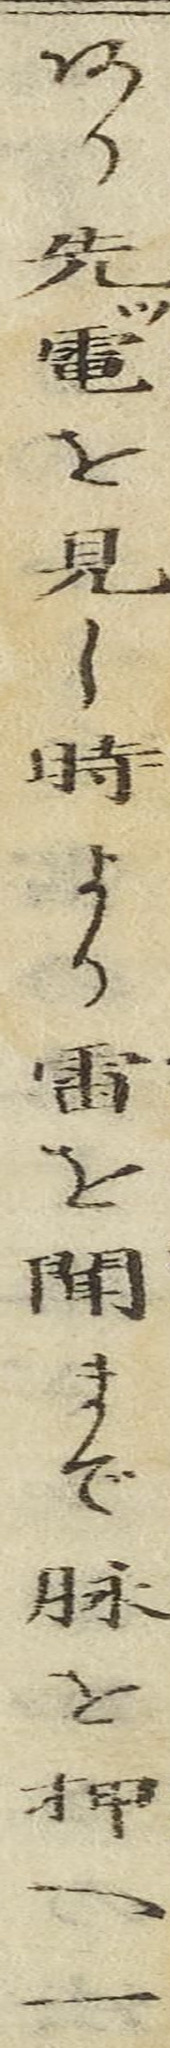あり先ツ電を見し時より雷を聞まで脈を押へ一
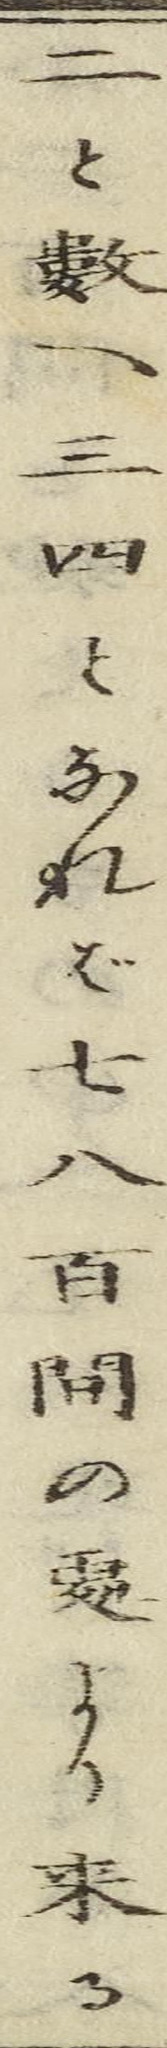二と数へ三四となれば七八百間の処より来る
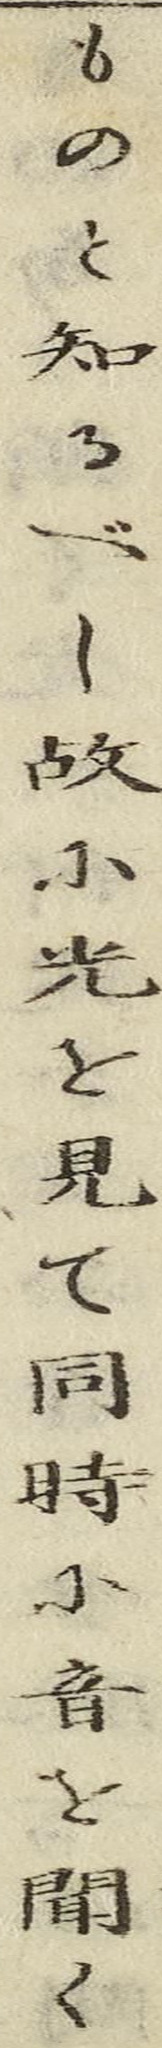ものと知るべし故に光を見て同時に音を聞く
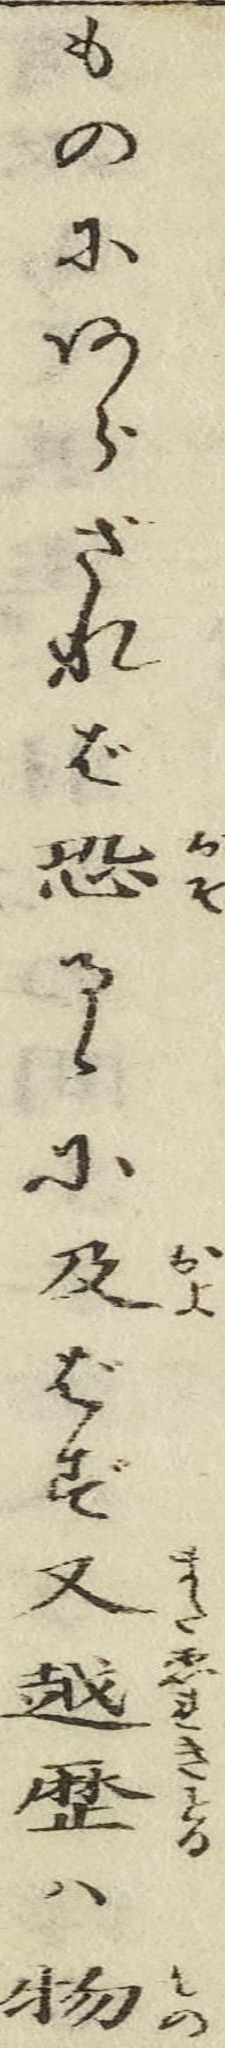ものにあらざれば恐るゝに及ばず又越歴は物
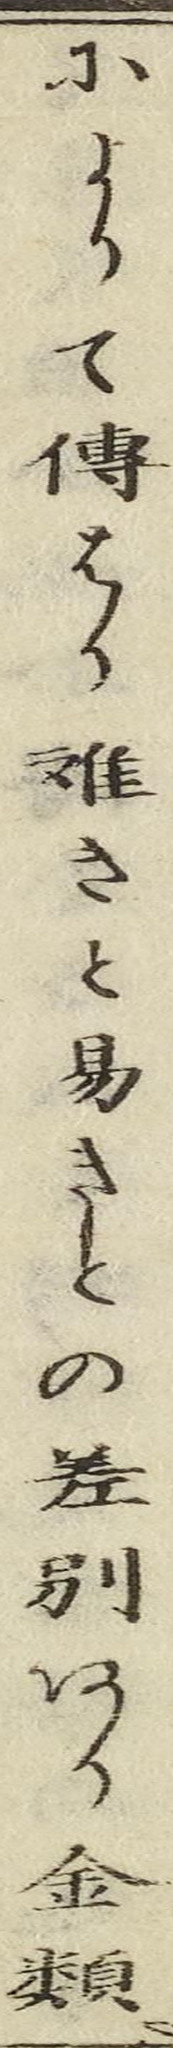によりて伝はり難きと易きとの差別あり金類。
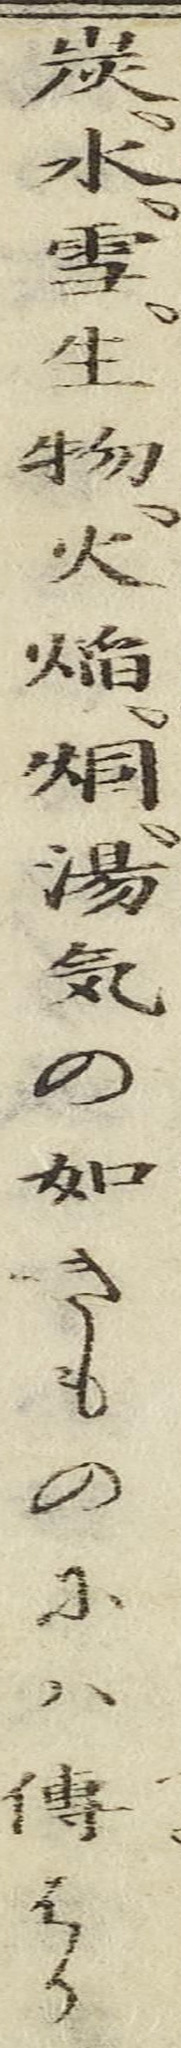炭。水。雪。生物。火焔。烔。湯気の如きものには伝はり
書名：天変地異
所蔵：東京大学地震研究所図書室 Earthquake Research Institute Library, The University of Tokyo, JAPAN
